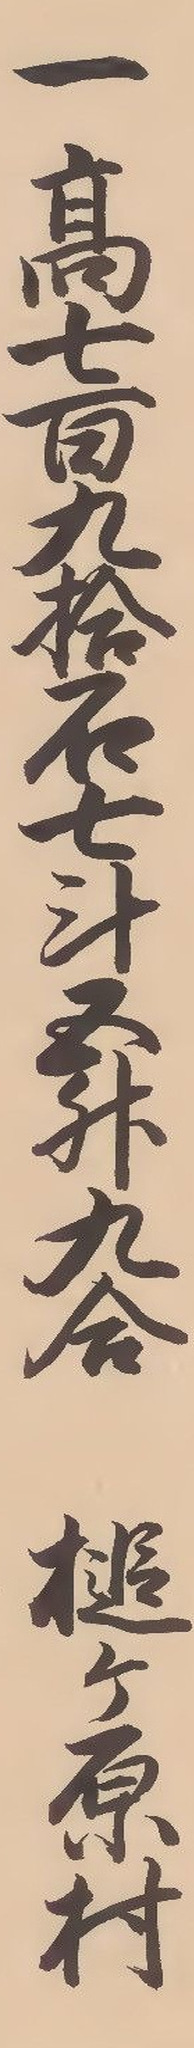一髙七百九拾石七斗五升九合槌ケ原村
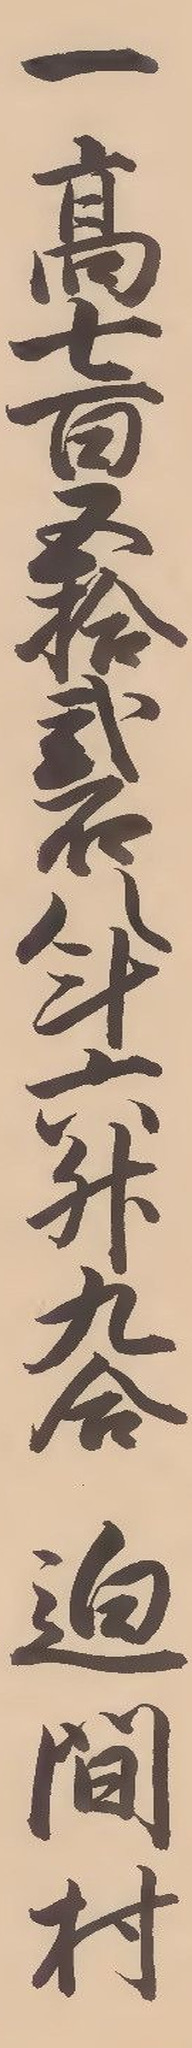一髙七百五拾弐石八斗六升九合迫間村
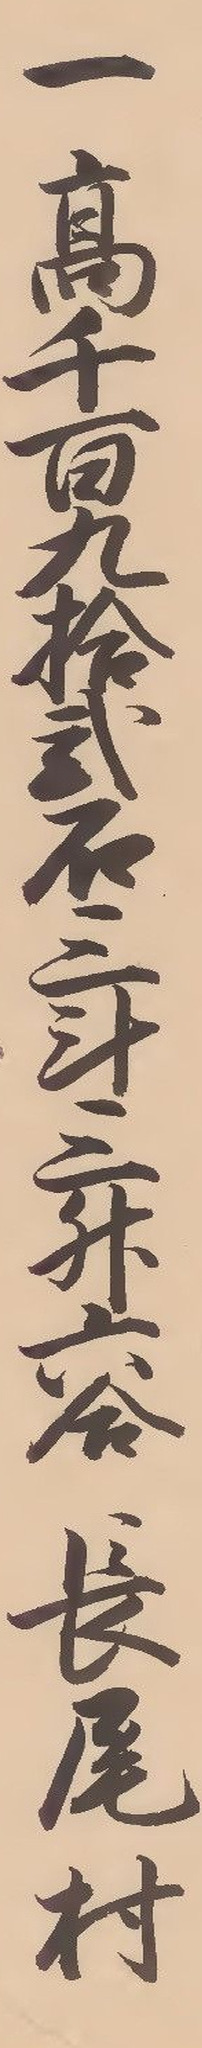一髙千百九拾弐石三斗三升六合長尾村

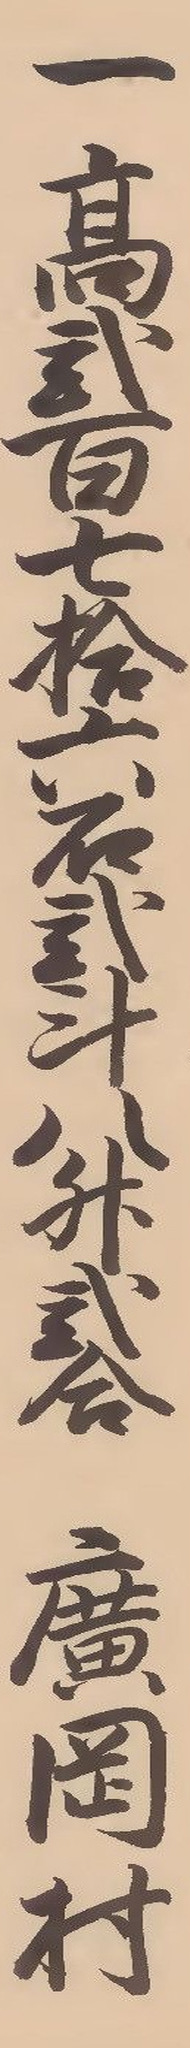一髙弐百七拾六石弐斗八升弐合廣岡村
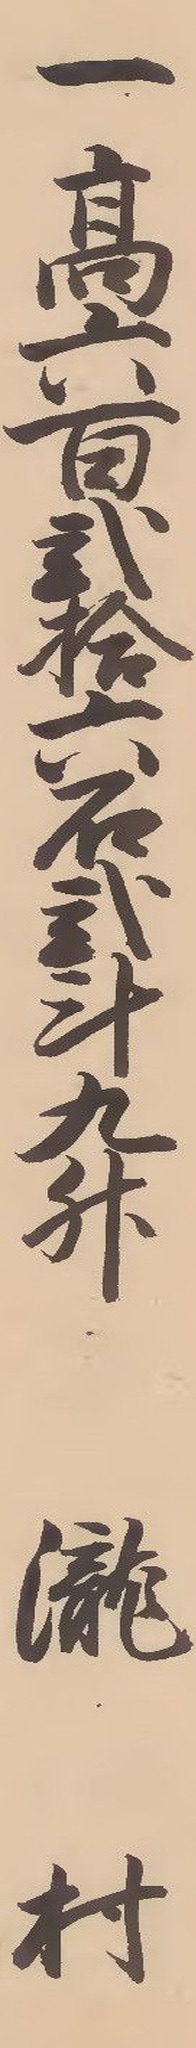一髙六百弐拾六石弐斗九升瀧村
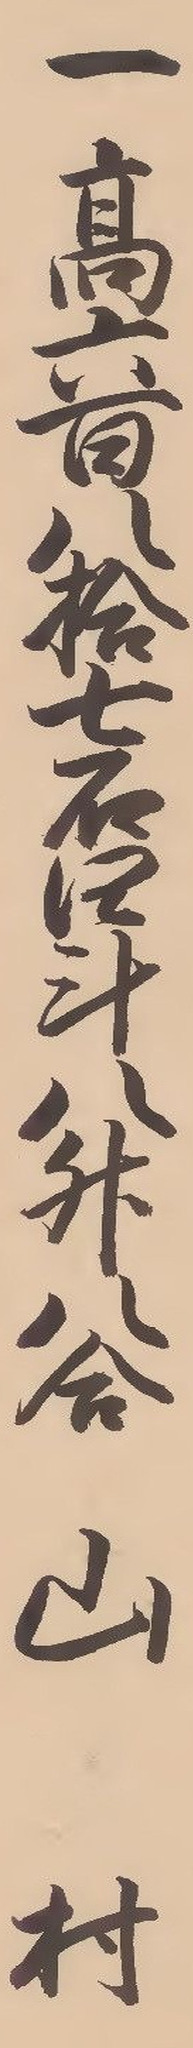一髙六百八拾七石四斗八升八合山村
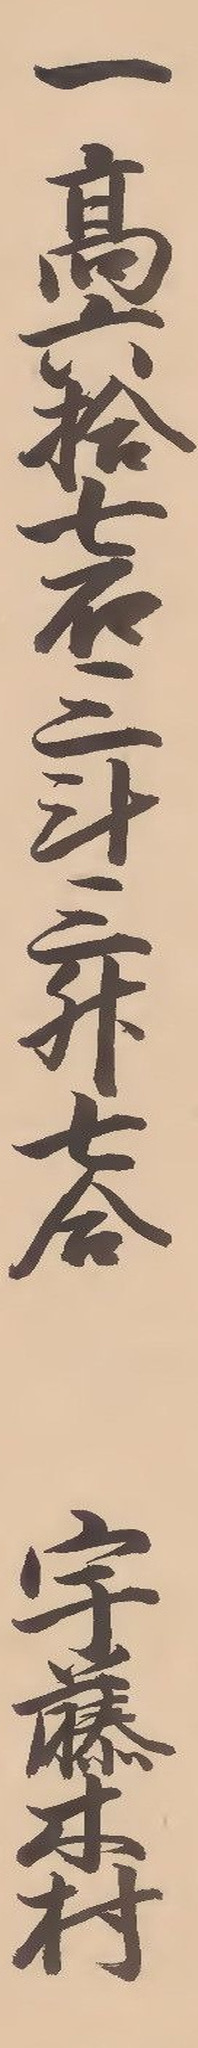一髙六拾七石三斗三升七合宇藤木村
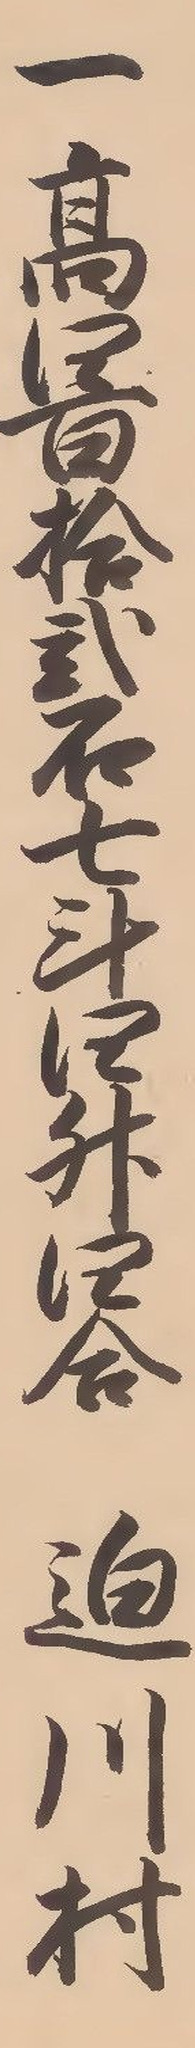一髙四百拾弐石七斗四升四合迫川村
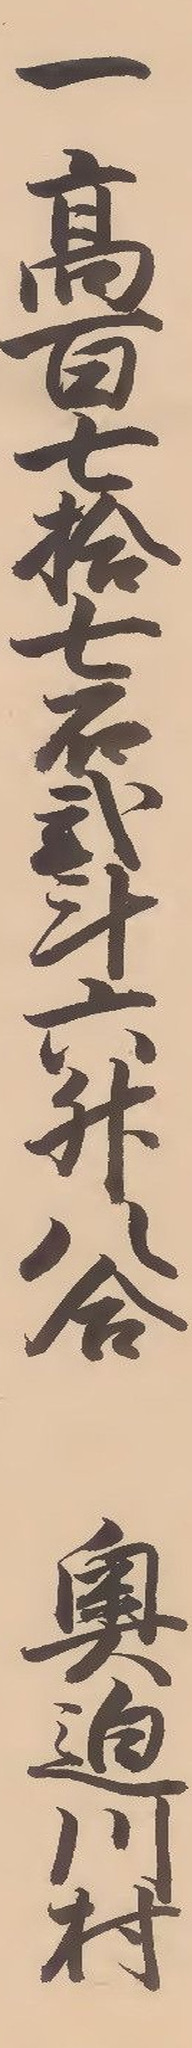一髙百七拾七石弐斗六升八合奥迫川村
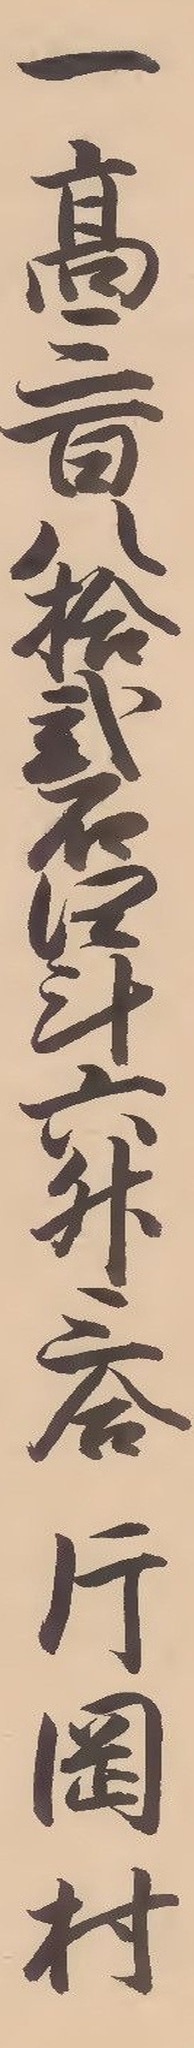一髙三百八拾弐石四斗六升三合片岡村
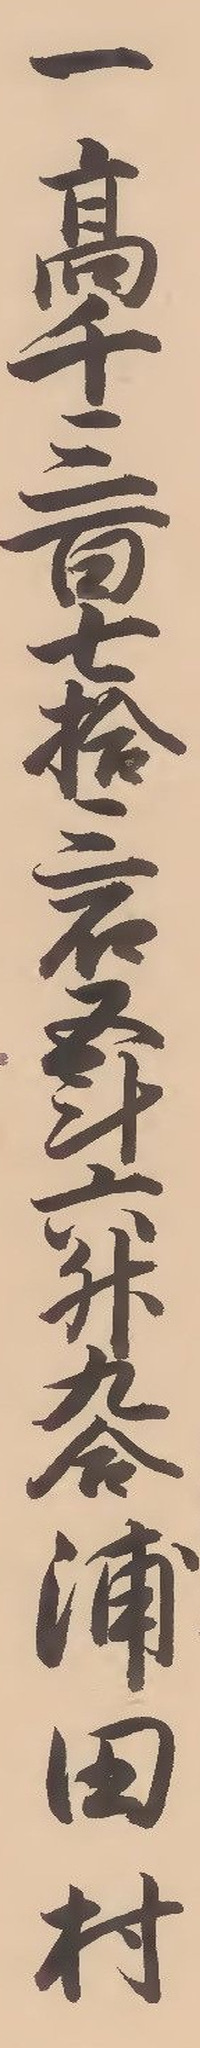一髙千三百七拾三石五斗六升九合浦田村

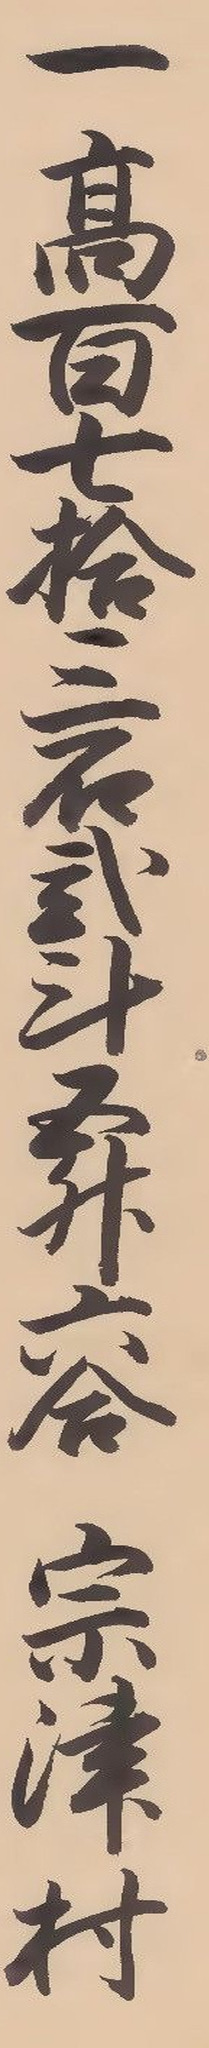一髙百七拾三石弐斗五升六合宗津村
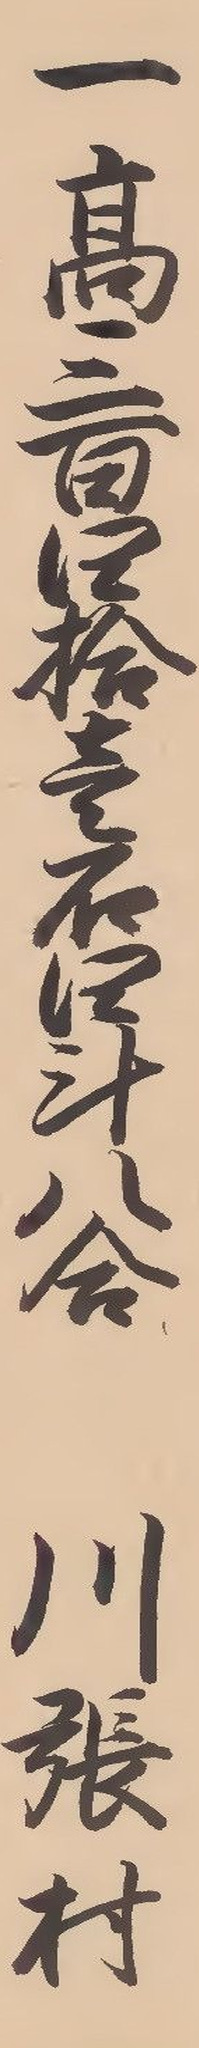一髙三百四拾壱石四斗八合川張村
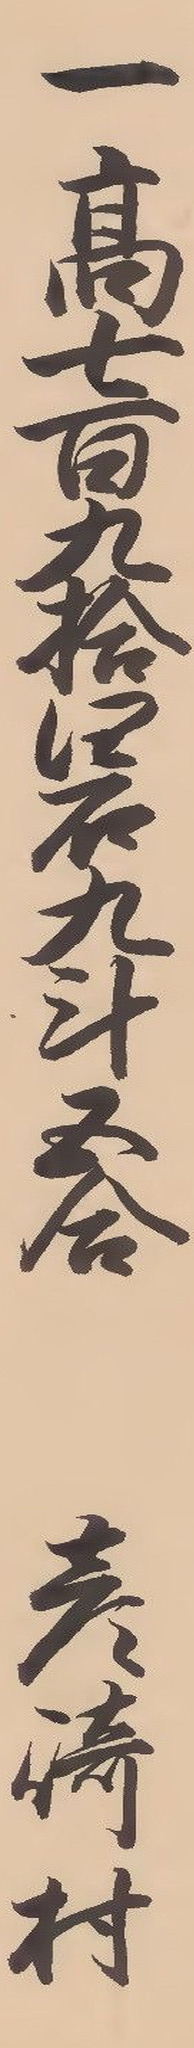一髙七百九拾四石九斗五合彦崎村
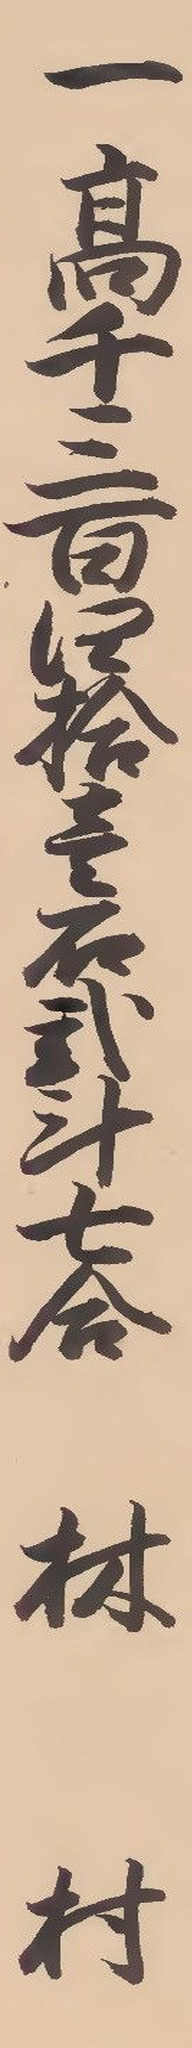一髙千三百四拾壱石弐斗七合林村
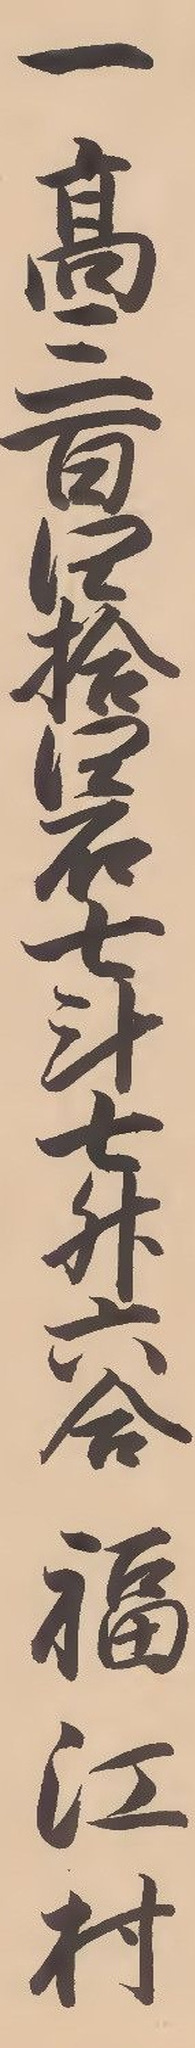一髙三百四拾四石七斗七升六合福江村
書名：備前国郷帳
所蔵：国立公文書館 National Archives of Japan
